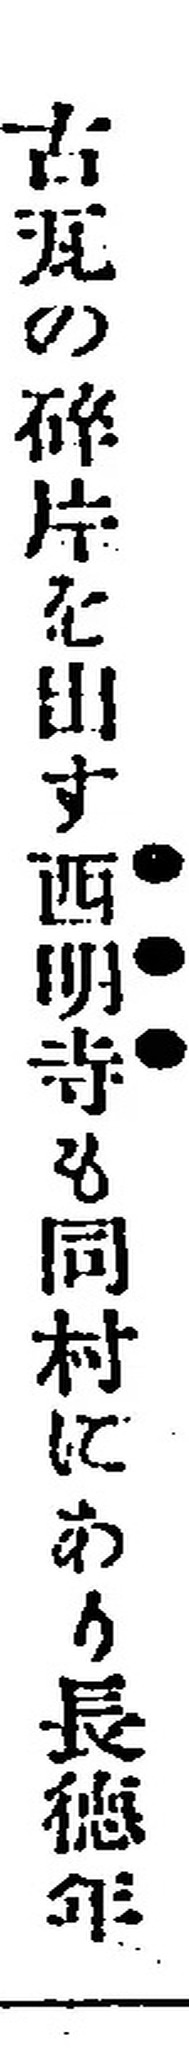古瓦の砕片を出す西明寺も同村にあり長徳年
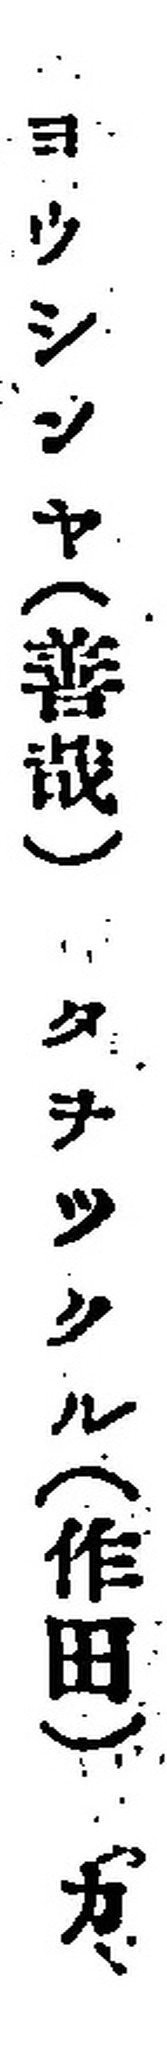ヨウシンヤ(善哉)タヲツクル(作田)カ
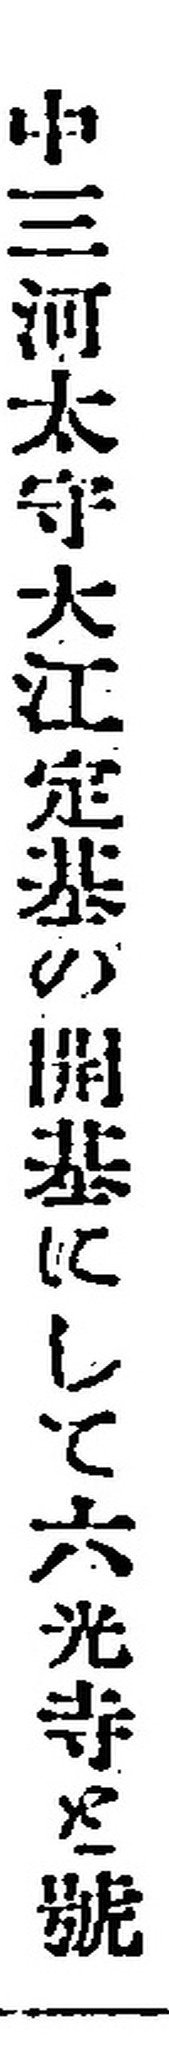中三河太守大江定基の開基にして六光寺と号
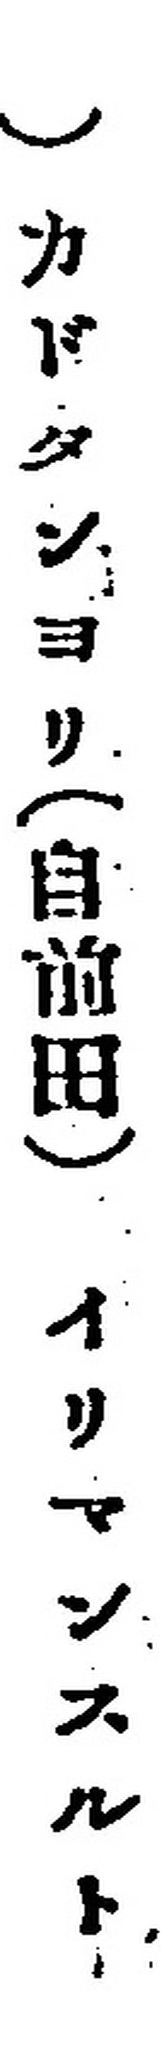)カドタンヨリ(自前田)イリマンスルト
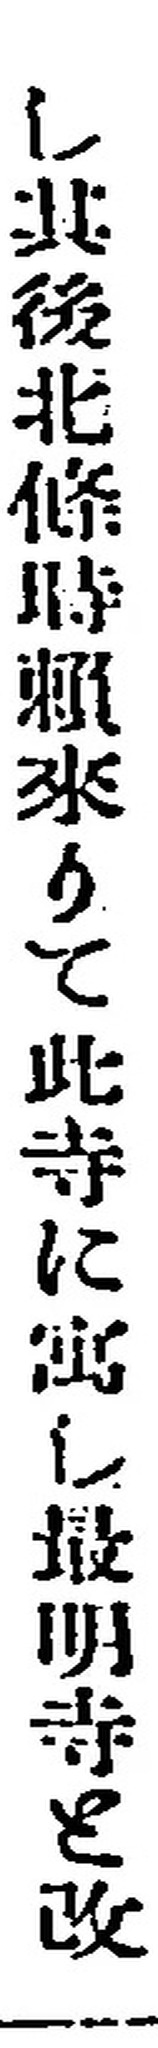し其後北条時頼来りて此寺に寓し最明寺と改
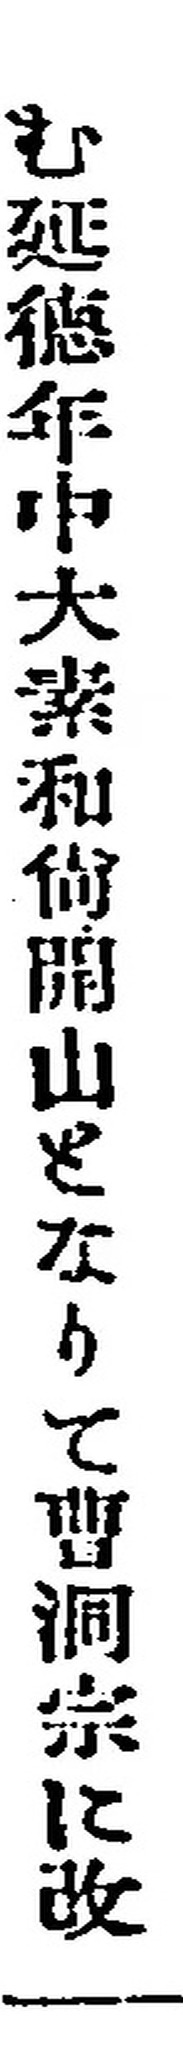む延徳年中大素和尚開山となりて曹洞宗に改
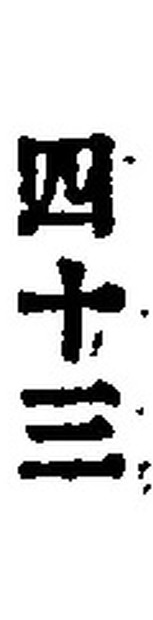四十三

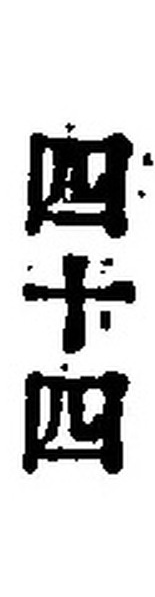四十四
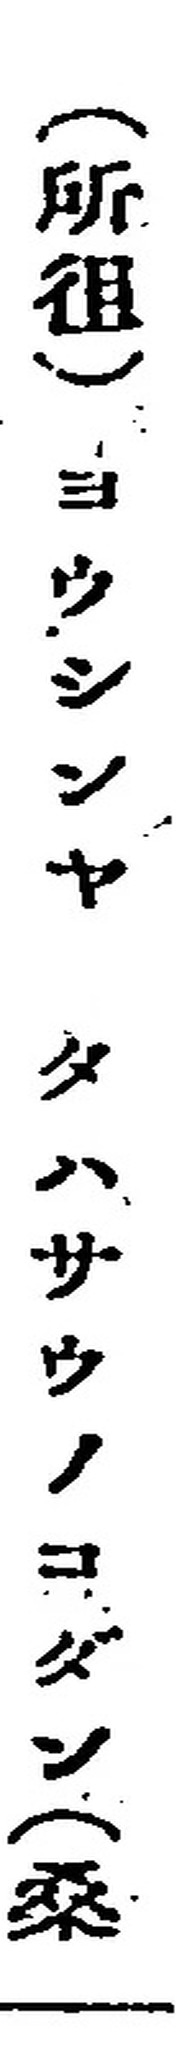(所徂)ヨウシンヤタハサウノコダン(桑
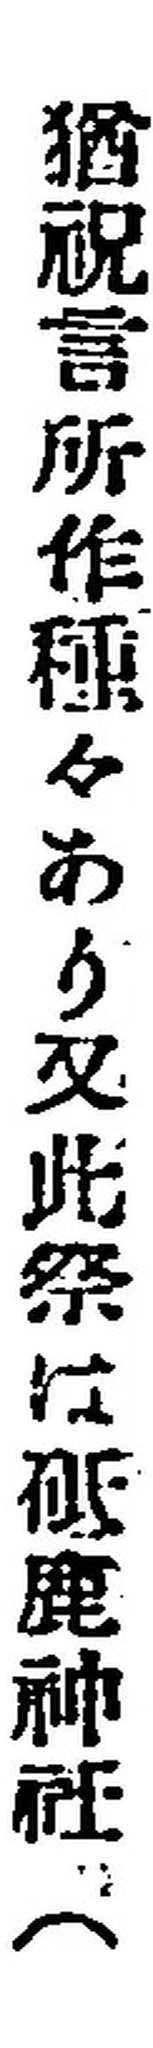猶祝言所作種々あり又此祭は砥鹿神社(
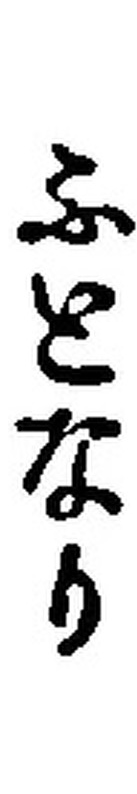ふとなり
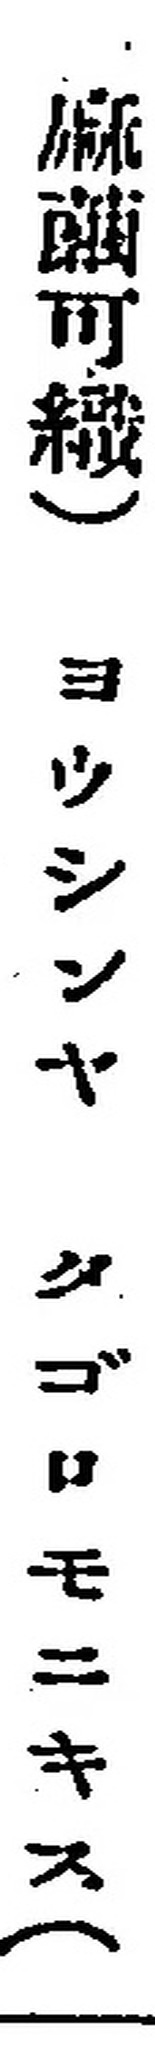麻繭可織)ヨウシンヤタゴロモニキス(
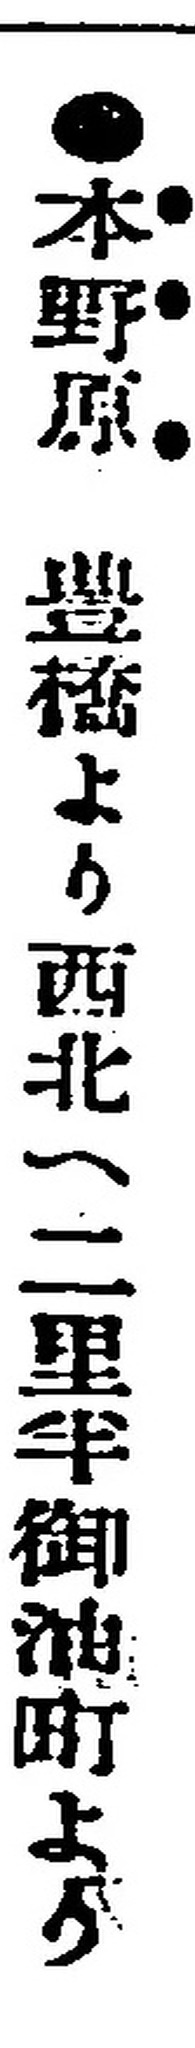●本野原豊橋より西北へ二里半御油町より
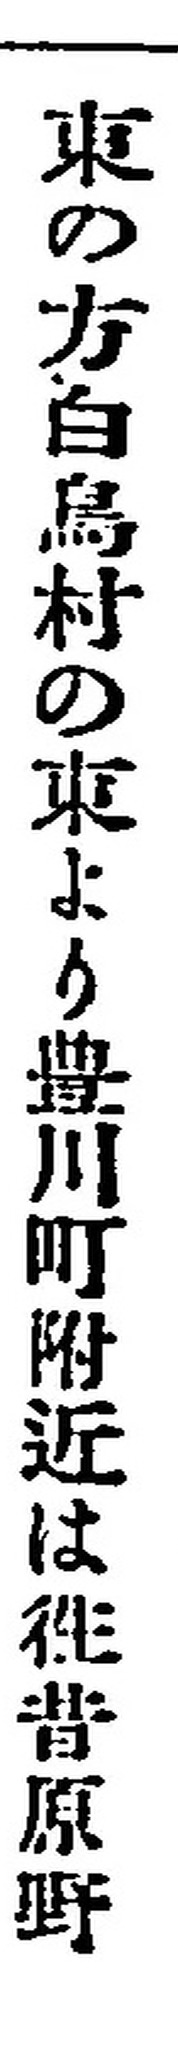東の方白鳥村の東より豊川町附近は往昔原野
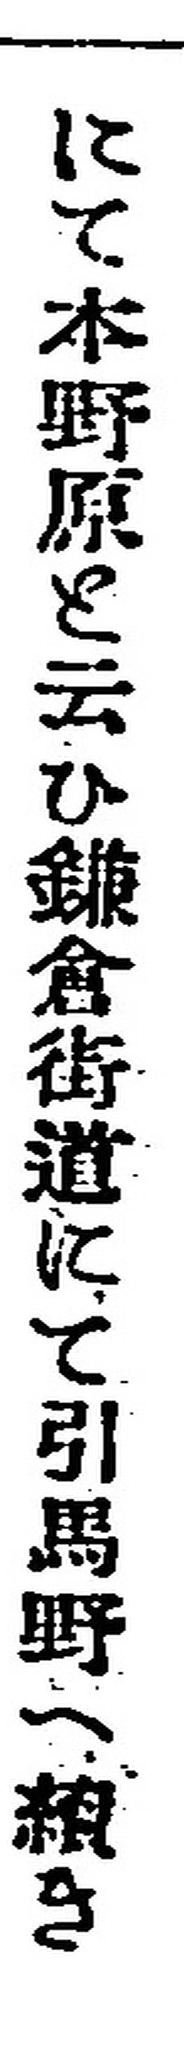にて本野原と云ひ鎌倉街道にて引馬野へ続き
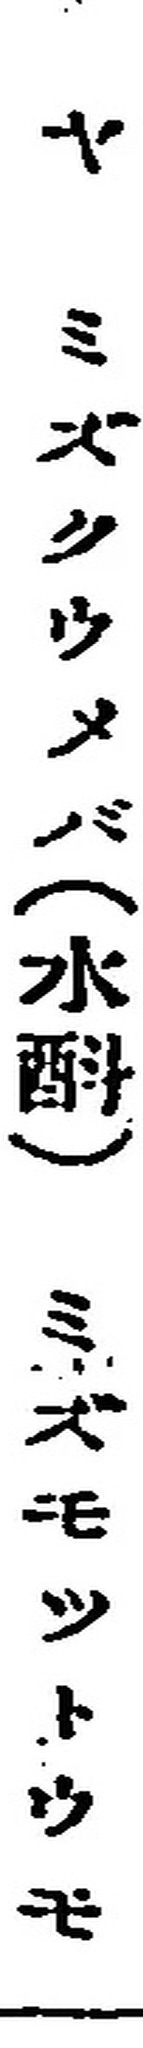ヤミズクウメバ(水酙)ミズモツトウモ
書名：東参名勝案内
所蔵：国立国会図書館 National Diet Library, JAPAN
